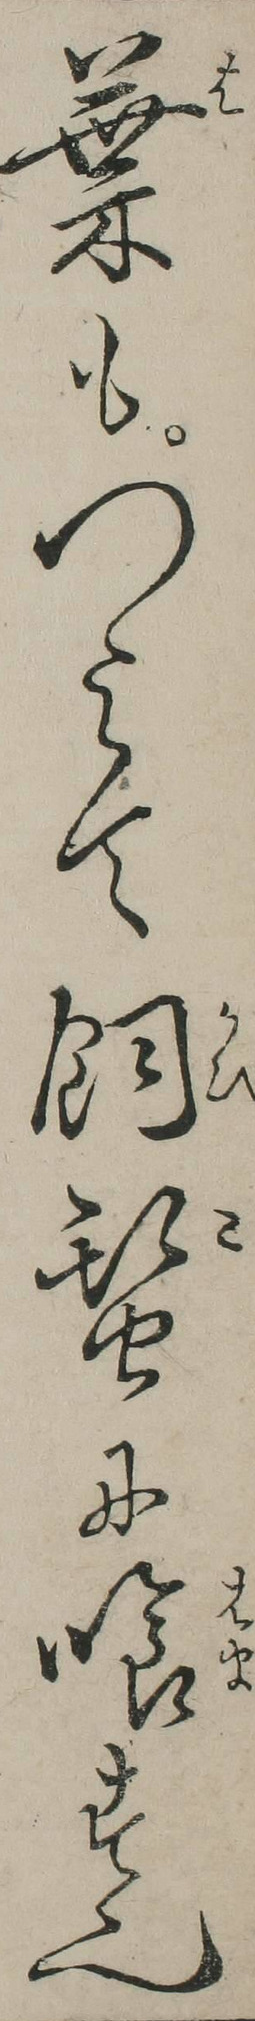葉も。つみて飼蚕に喰す也
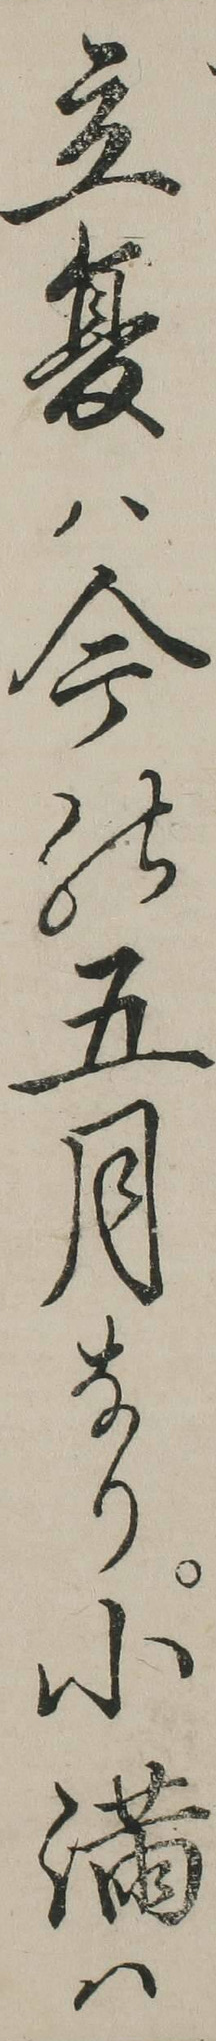立夏は今の五月なり。小満は
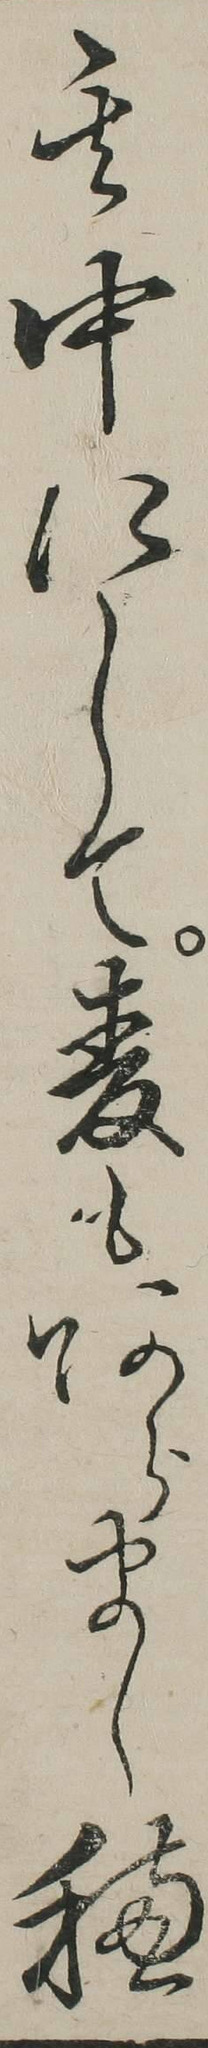其中にして。麦もあらまし穂
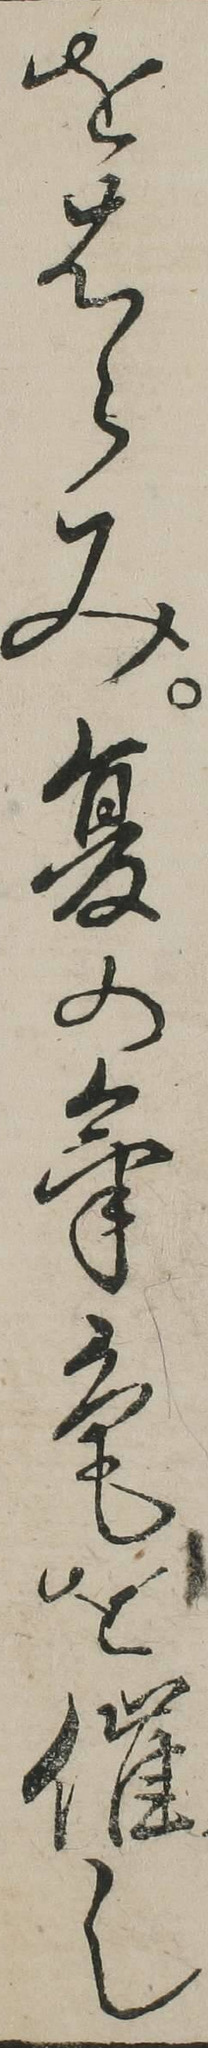をはらみ。夏の気色を催し
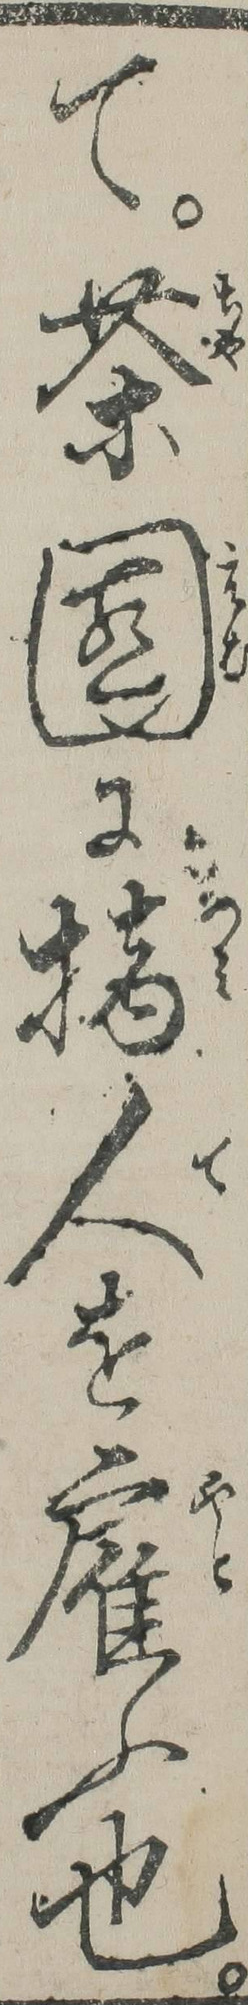て。茶園に摘人人を雇ふ也。
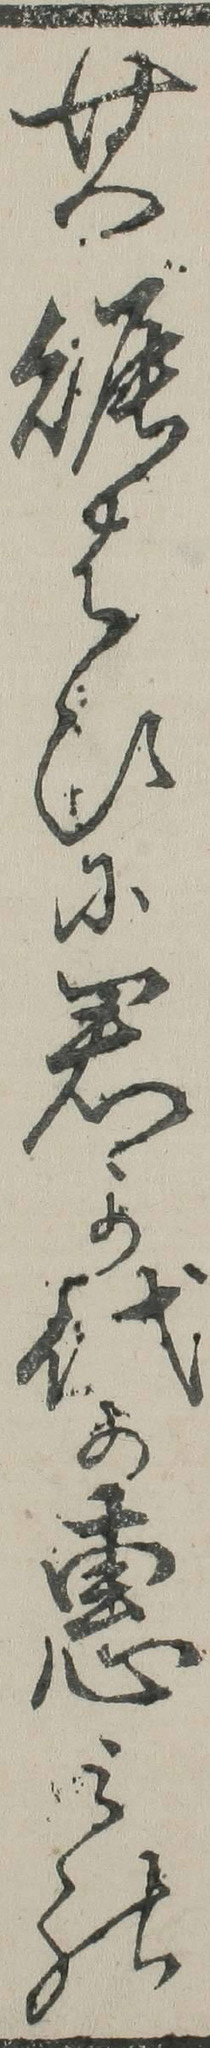其賑はひに君か代の。恵みの
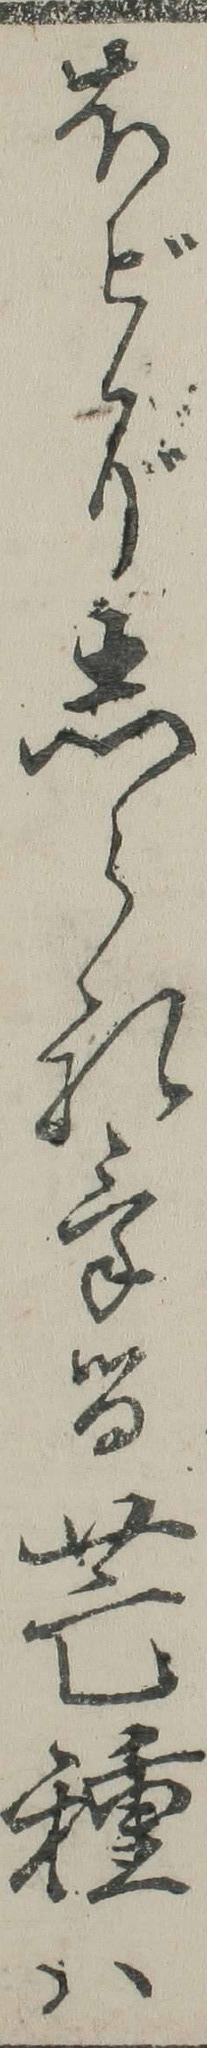ほどぞしられける。芒種は

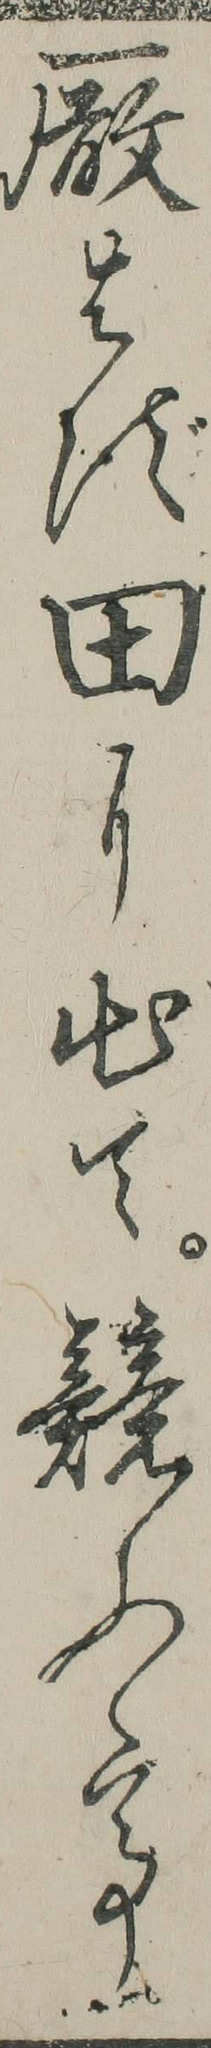厭はず田に出て。競ふて
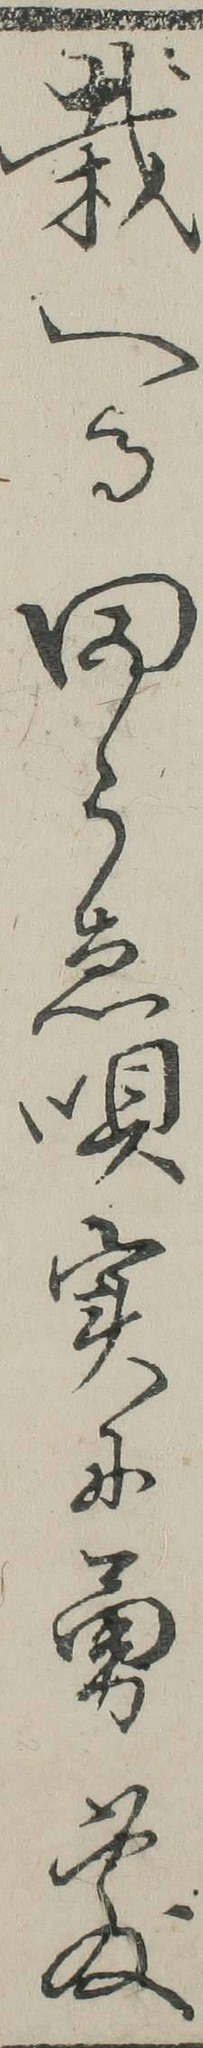栽へる田うゑ唄。実に勇敷
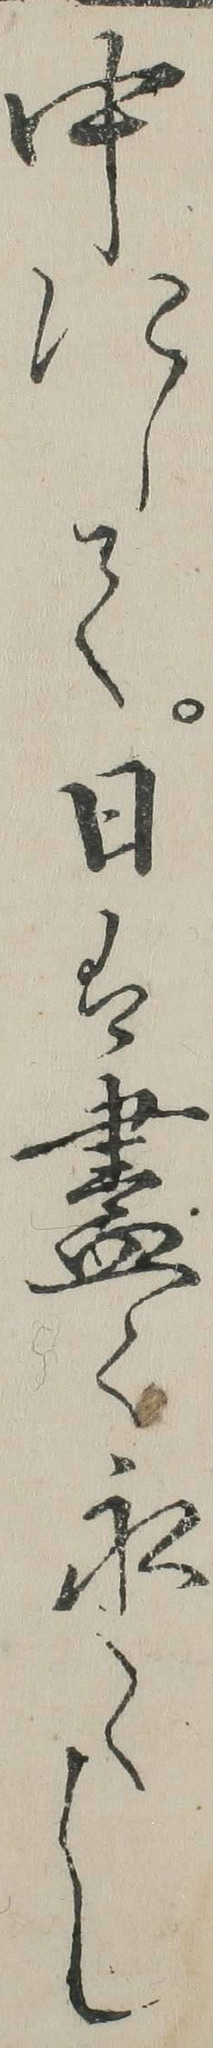中にして。日は尽く永くし
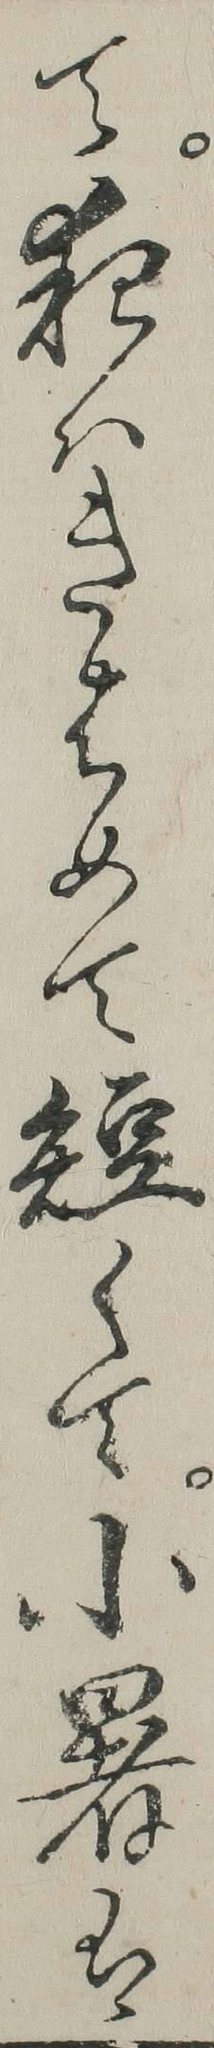て。夜はきはめて短くて。小暑は
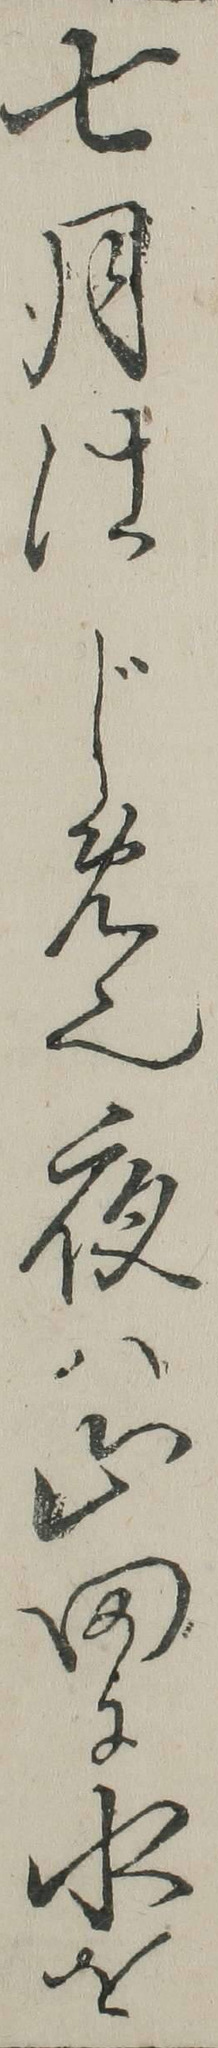七月はじめ也。夜は山田に水を
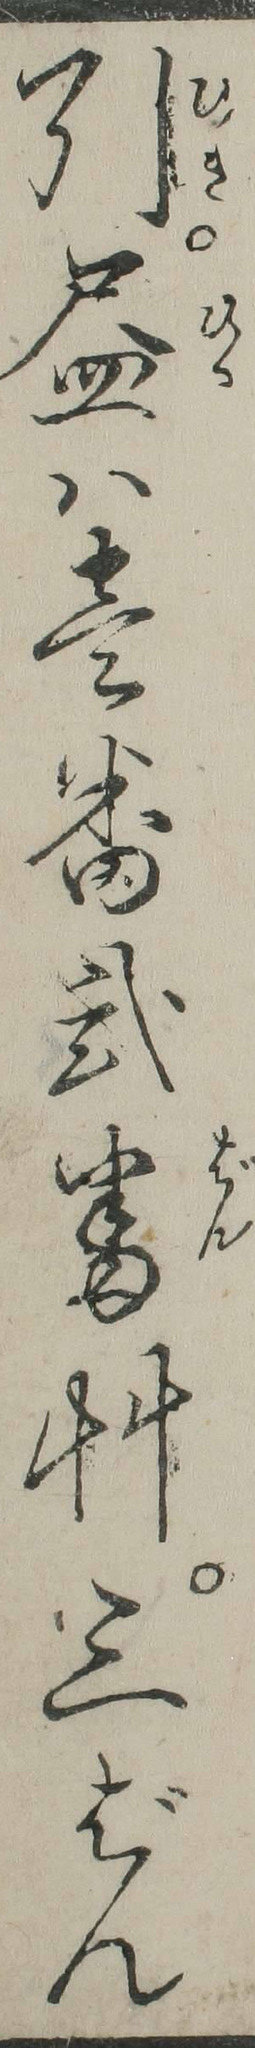引。昼は壱番弐番草。三ばん

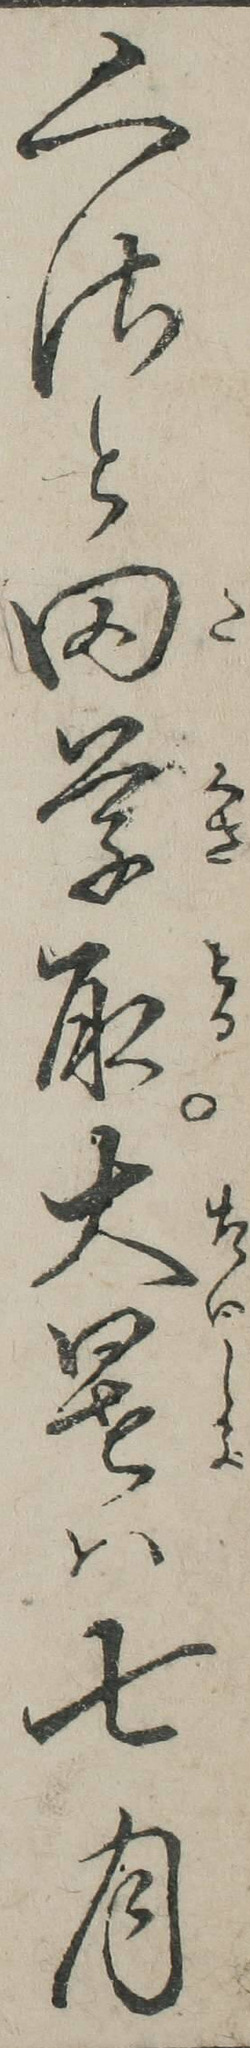くさと田草取。大暑は七月
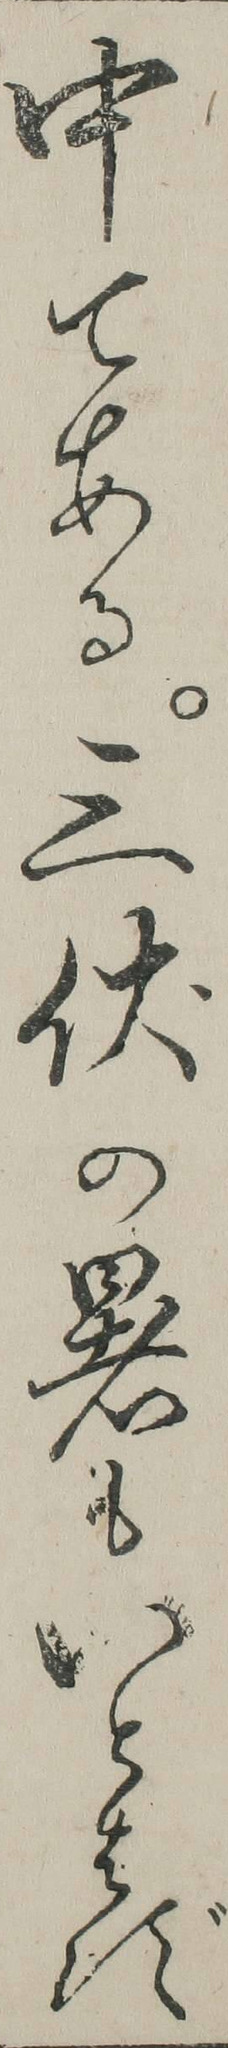中てある。三伏の暑もいとはず
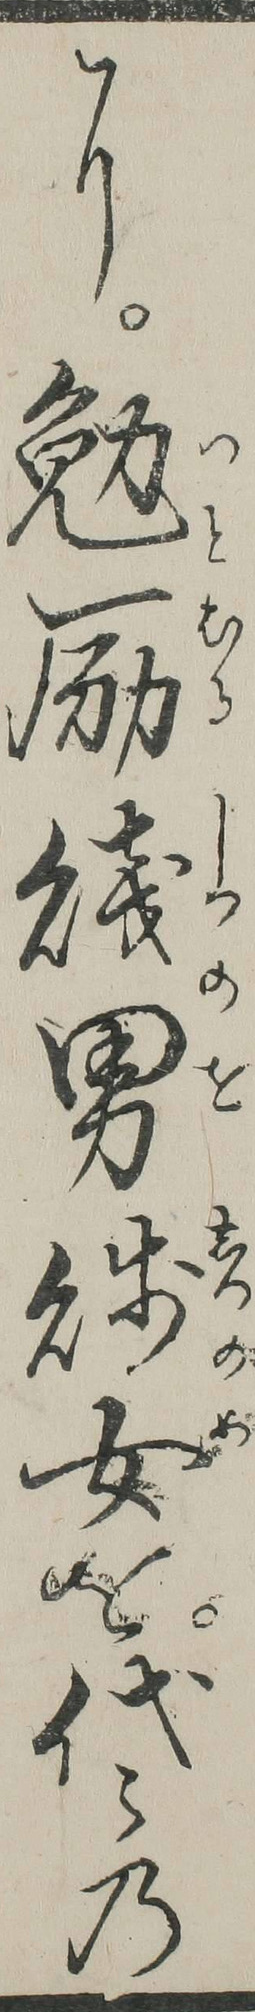に。勉励賤男賤女を。代々の
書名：農蠶必要日読往来
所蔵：東京学芸大学附属図書館 国文学研究資料館
